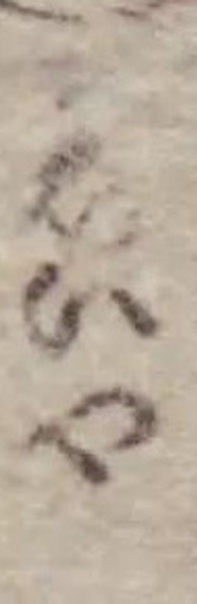ゑいや
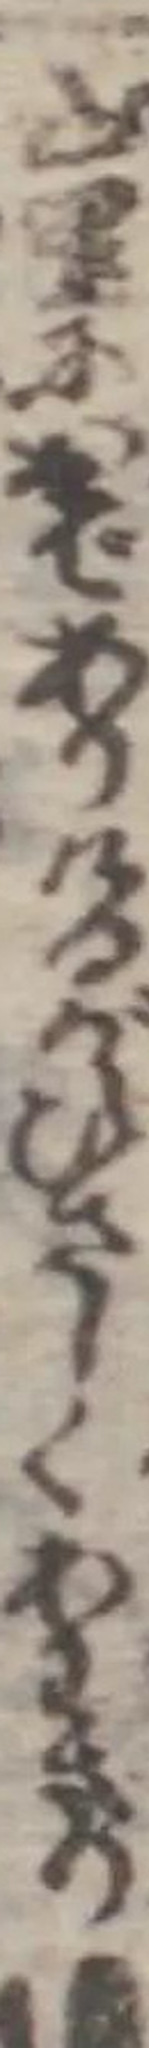山里におばありけるがひさしくあわさり
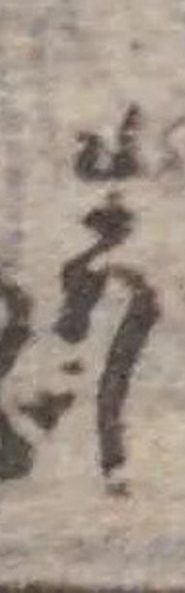まはし
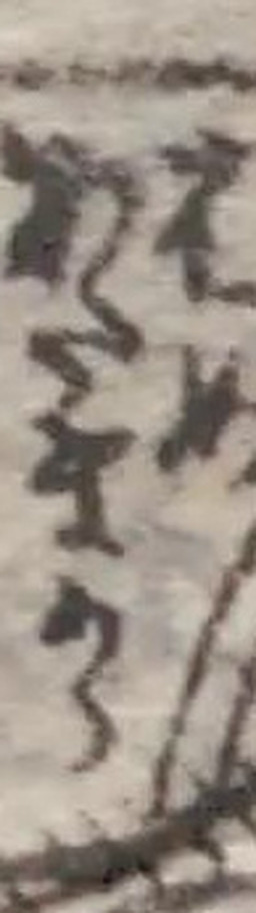あたまから
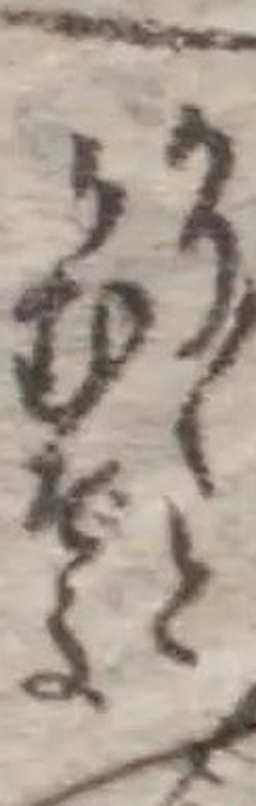かむぞよ

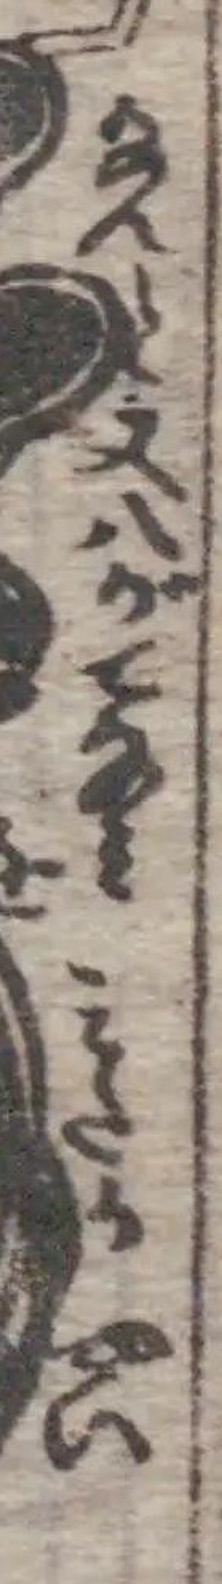なんと又八がてなみ
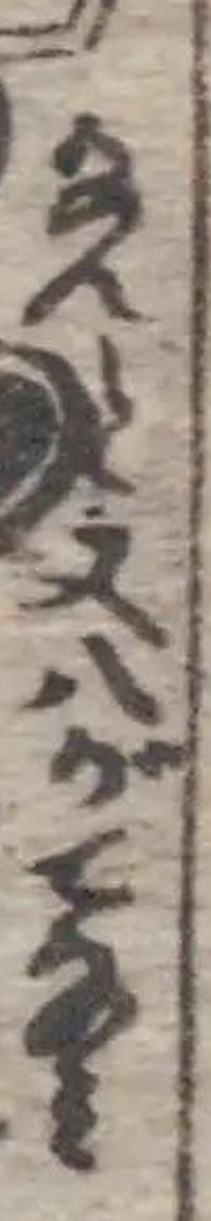なんと又八がてなみ
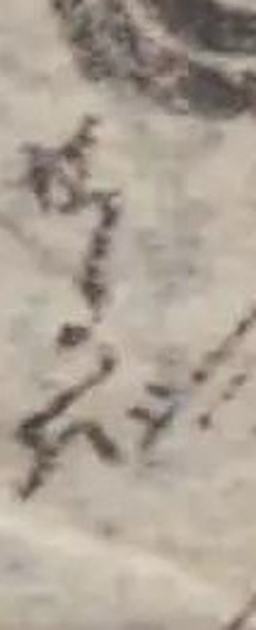せしかば
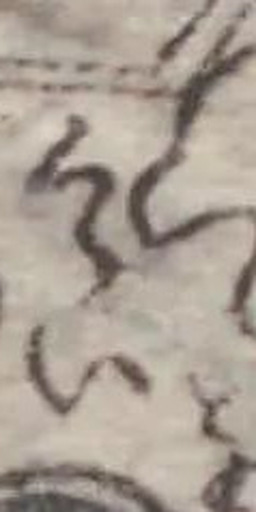くらい
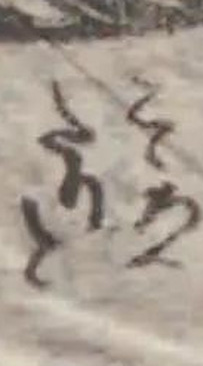たりと
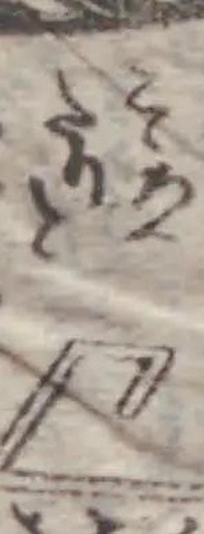たりと
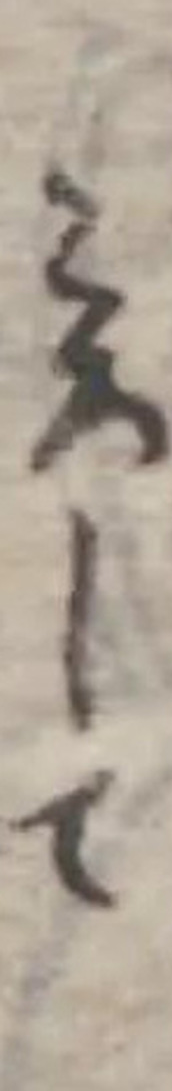ころして
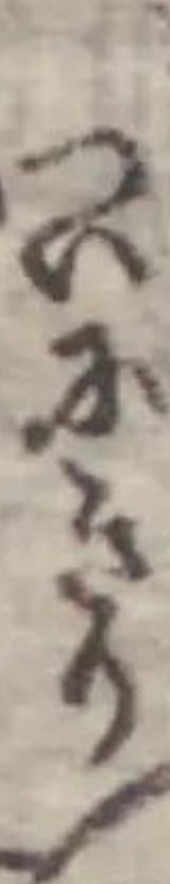ついにきり
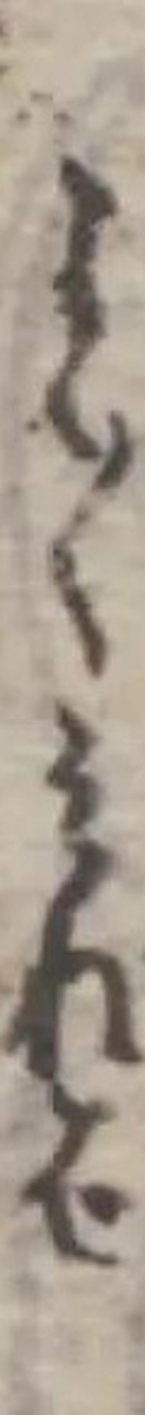よく〳〵みれば
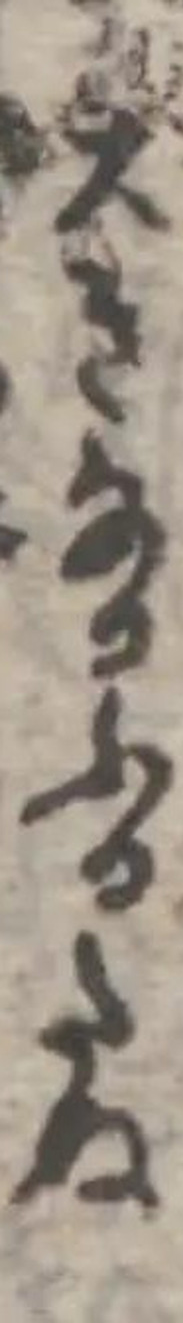大きなるふるたぬ
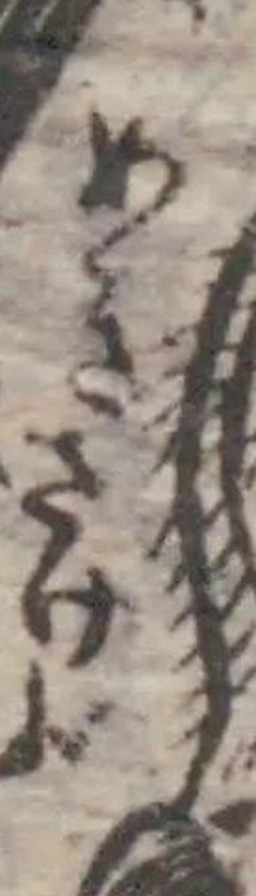めきさけぶ
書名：鎌田又八 2巻
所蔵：国立国会図書館 National Diet Library, JAPAN
